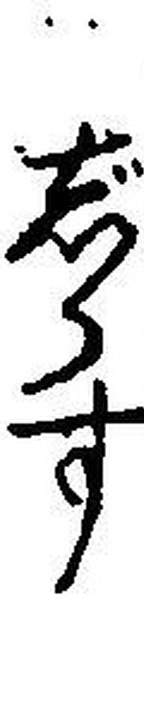じらす
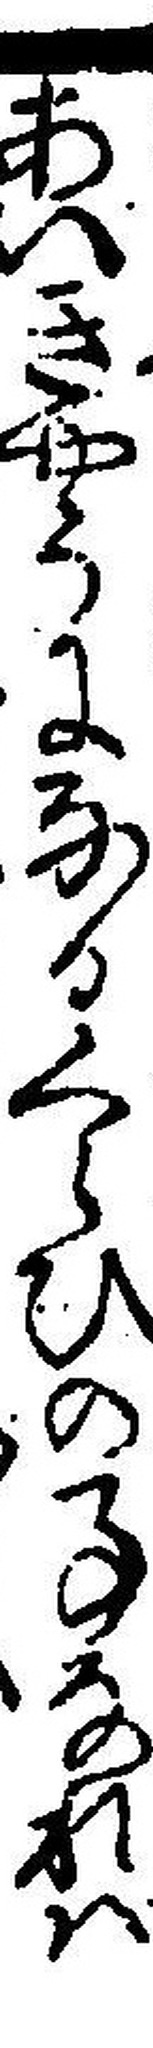あいきやうになるくらひの事なれは
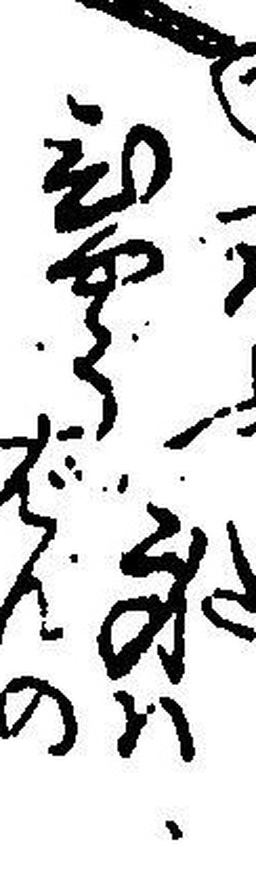ひやうばんの
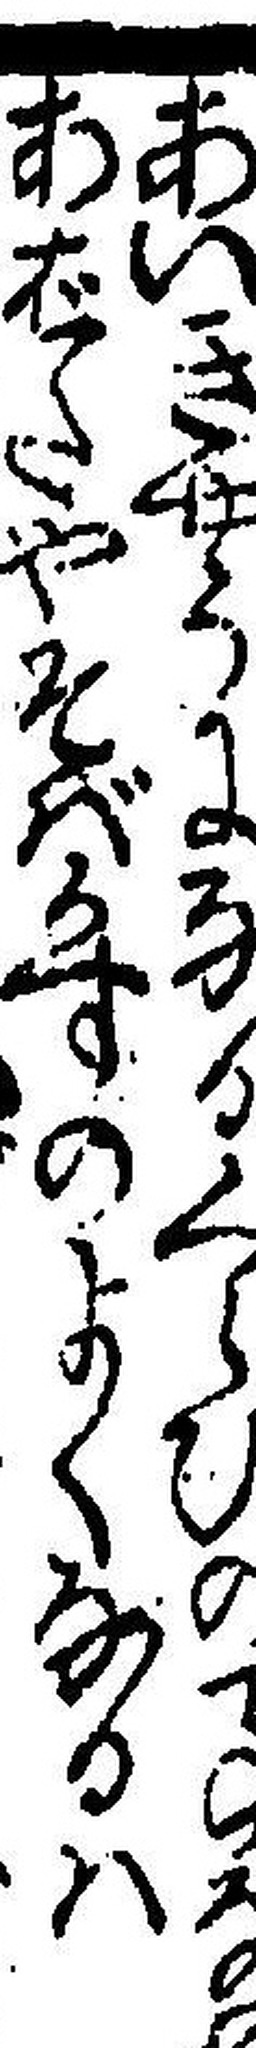あばたやそばかすのよくなるは
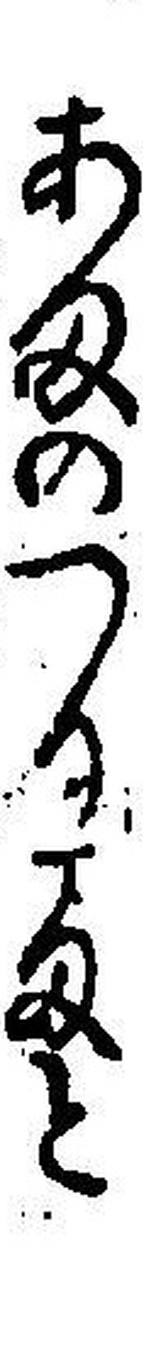あまのつり舟と
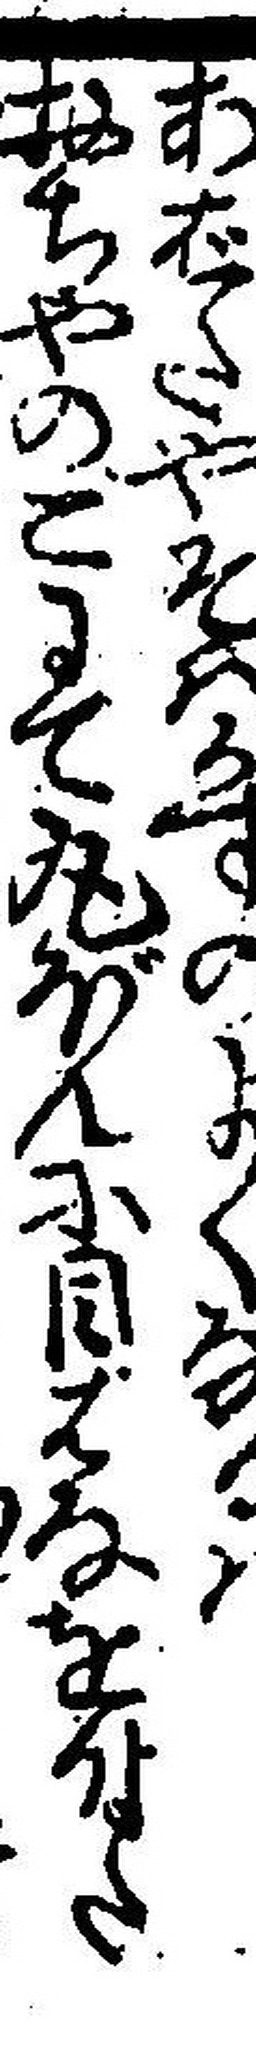おちやのこにて丸ぼんに目はなを付た
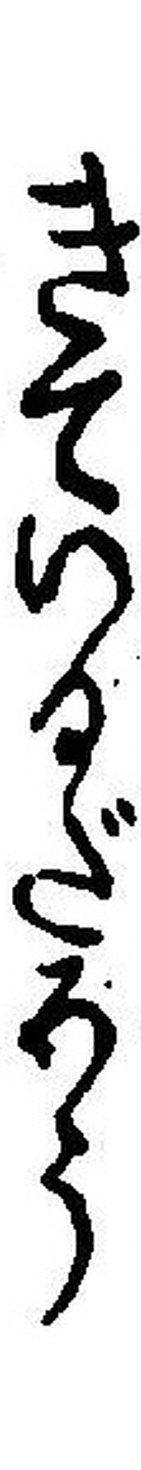きているだろう
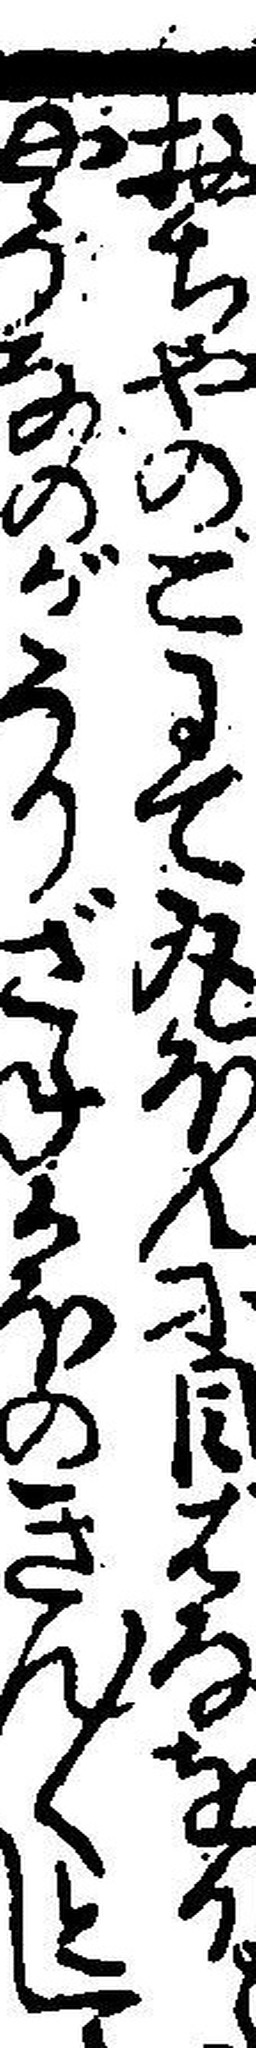やうなのがうりざねかほのきん〳〵とした
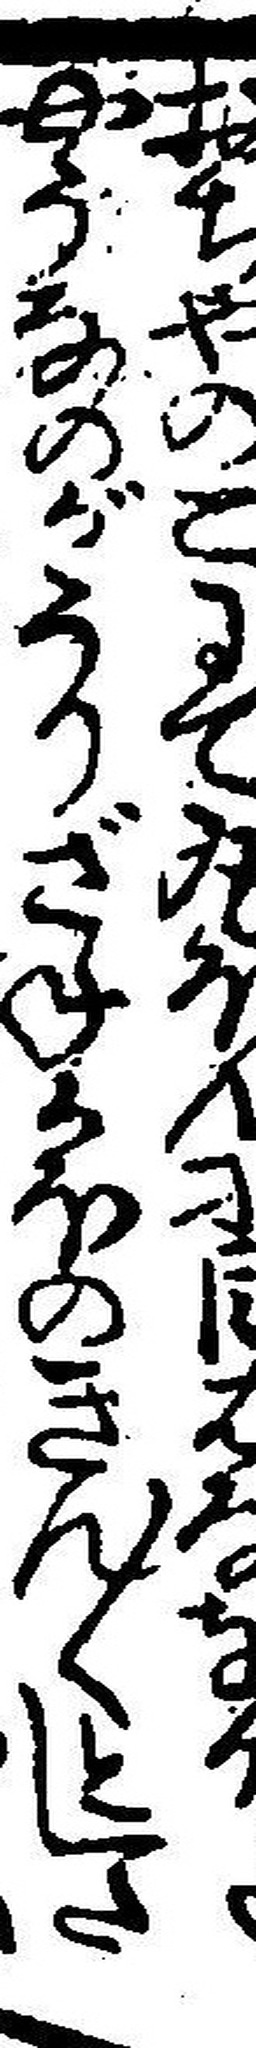やうなのがうりざねかほのきん〳〵とした
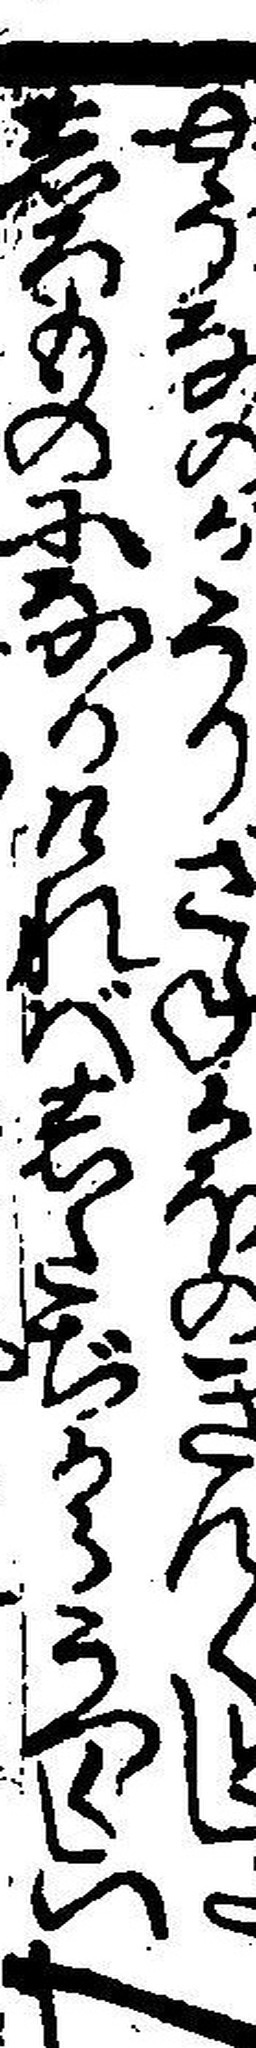しろものになりければしたぢからうつくしい
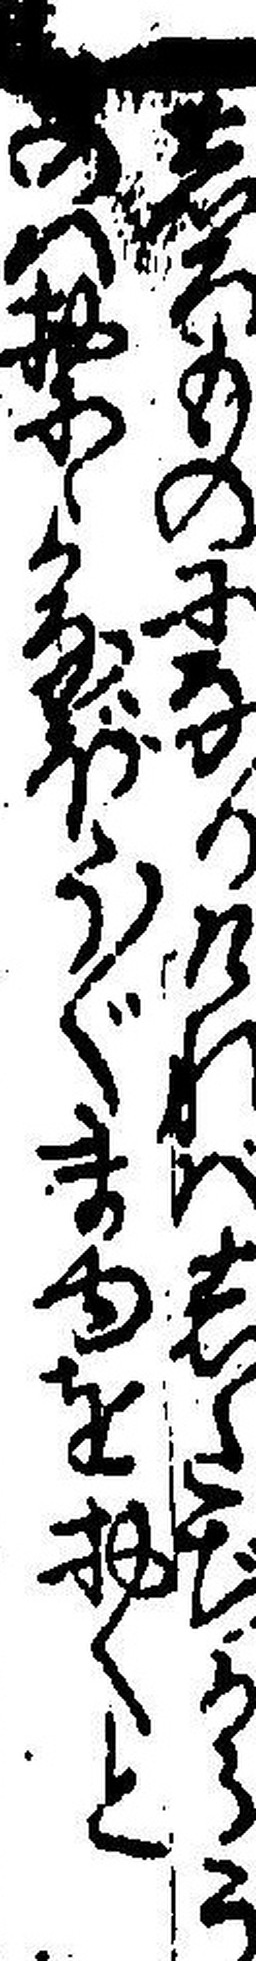のはおにゝかなぼう〴〵まゆをおくと
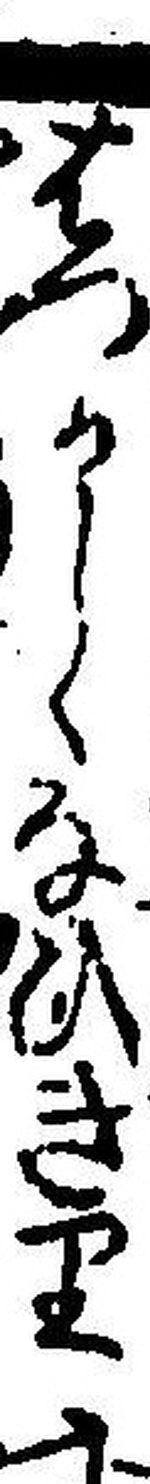はつかしくなひきり
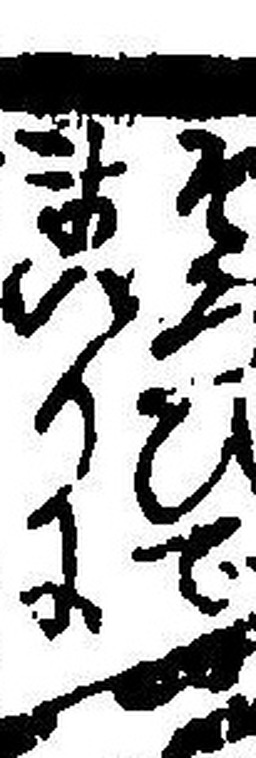まいりに
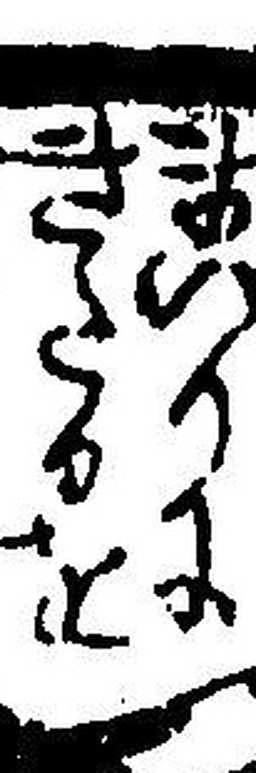きたるを
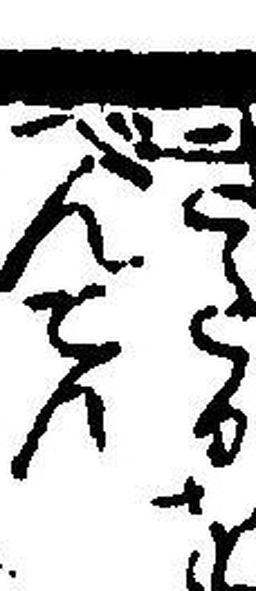べんてん
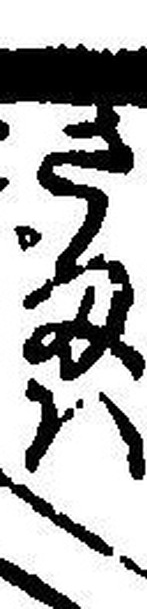さまは
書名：徳若水縁起金性 / 樹下石上作
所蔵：東京大学総合図書館 General Library in the University of Tokyo, JAPAN
